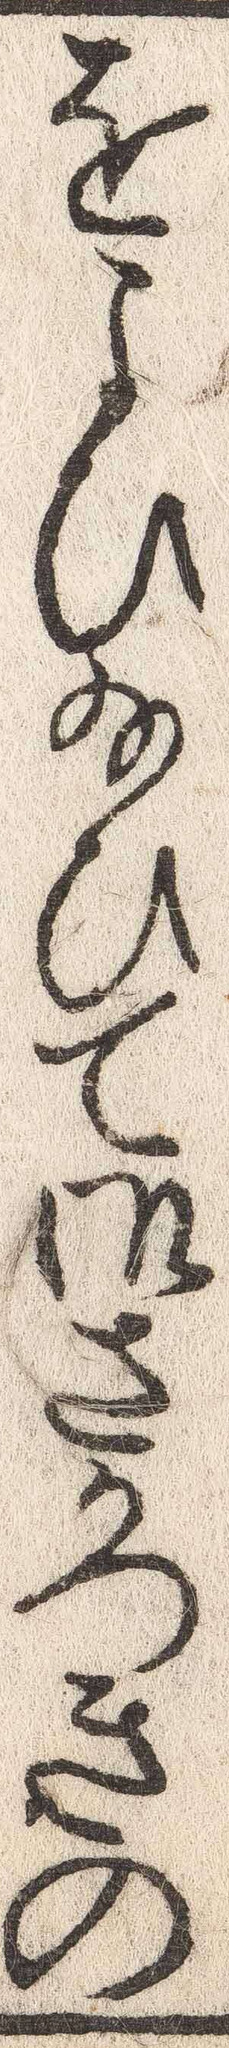をよひ給ひて御さかつきの
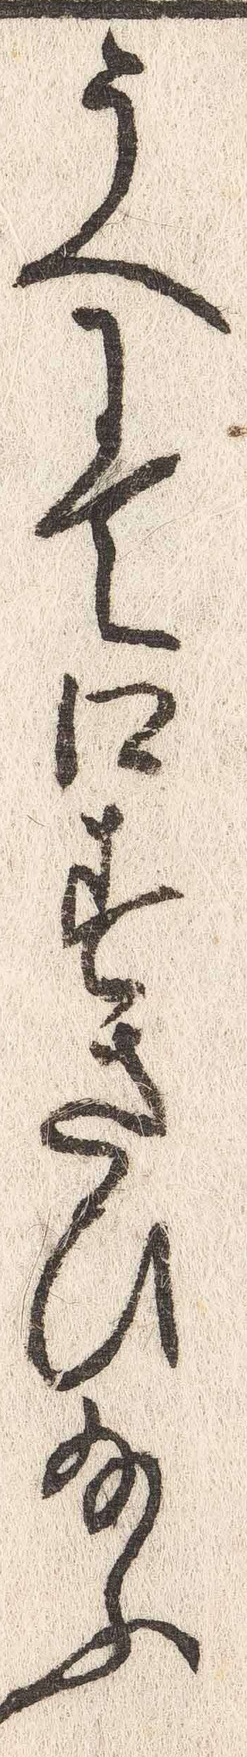うへにて口すさひ給ふ
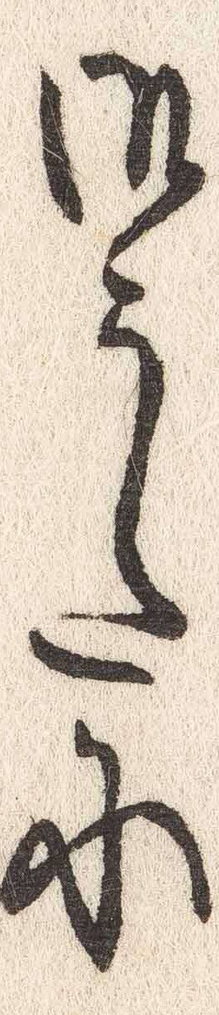御うたに
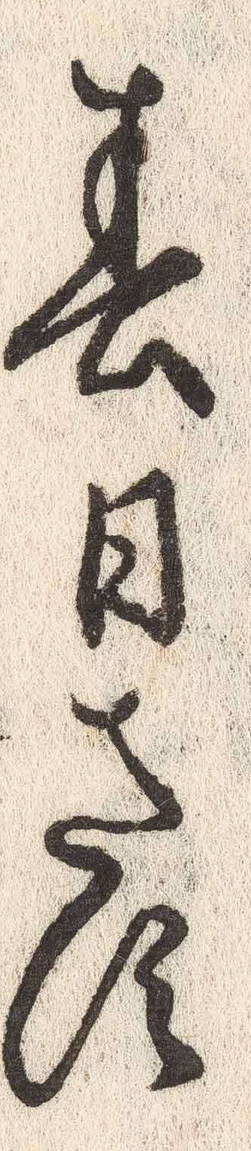春日さす
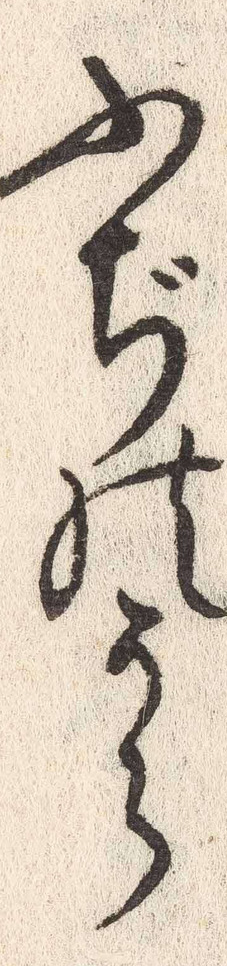ふぢのうら
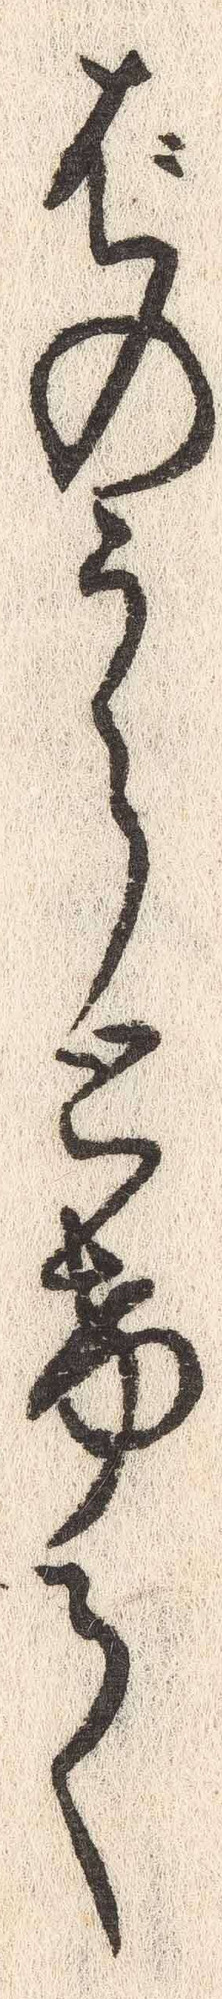ばのうらとけて
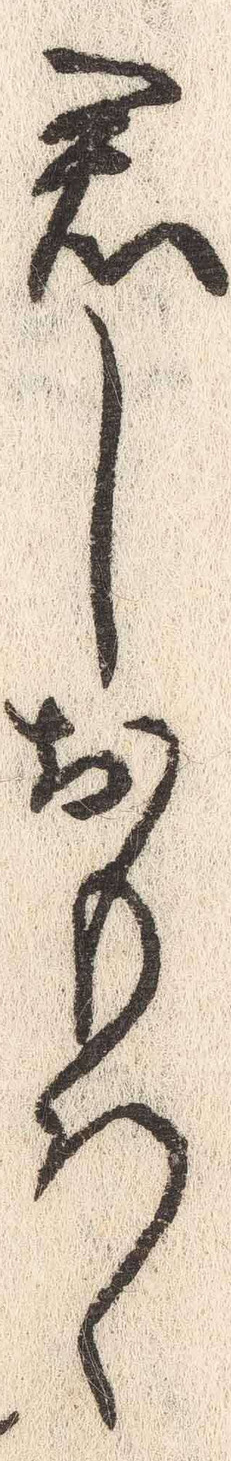君しおもはゝ
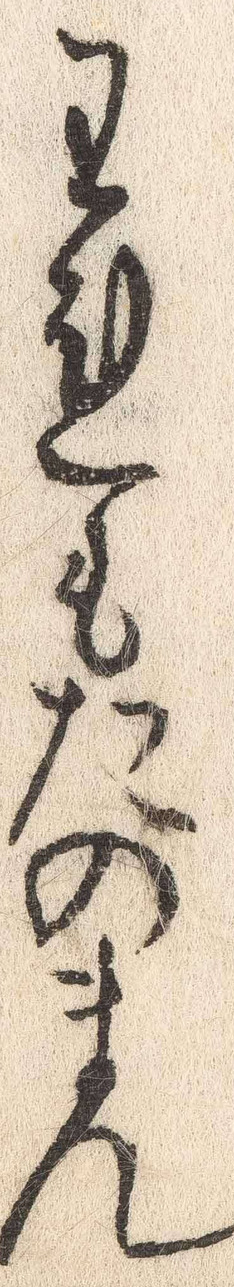われもたのまん

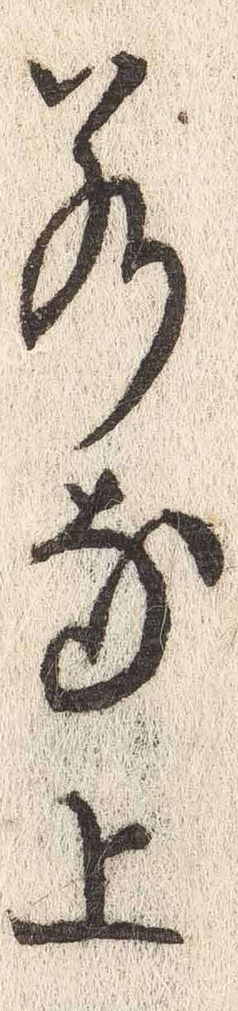若な上
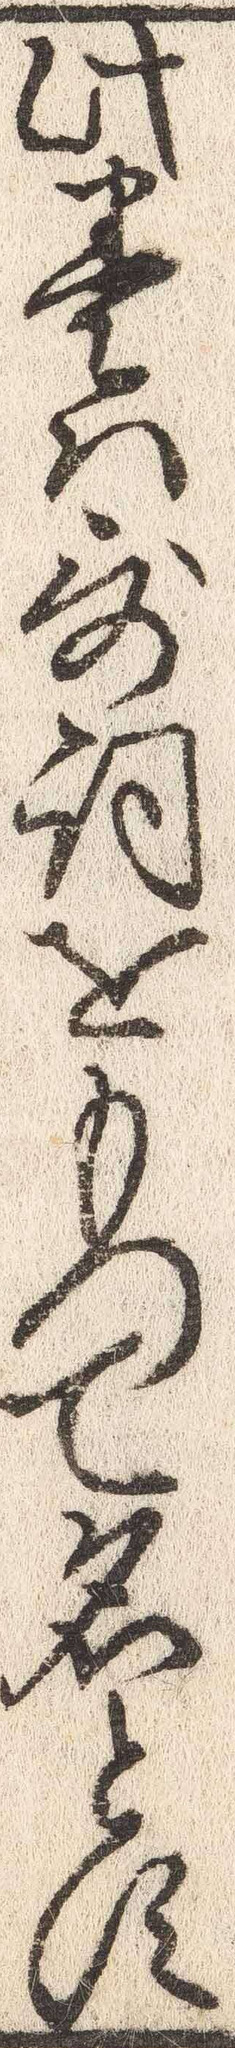此巻は哥詞をもつて名とす
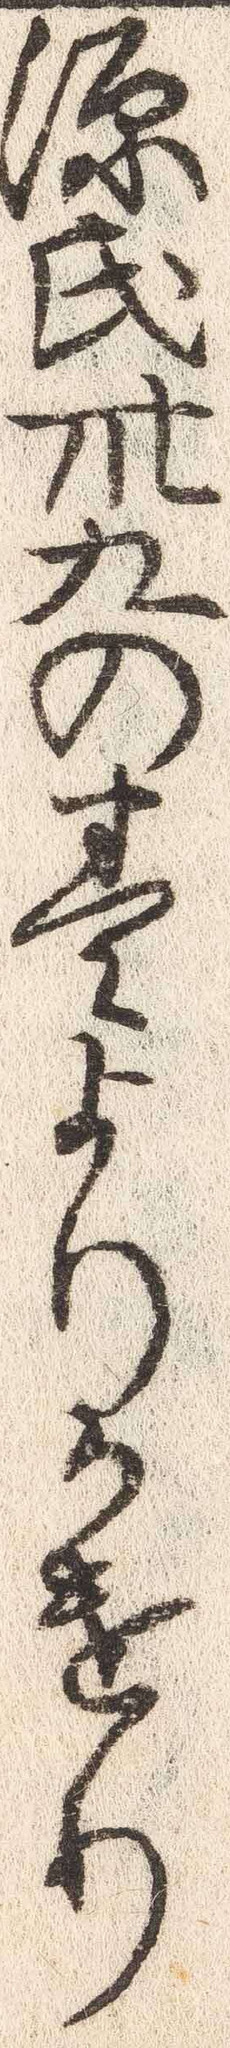源氏卅九の春よりかけり
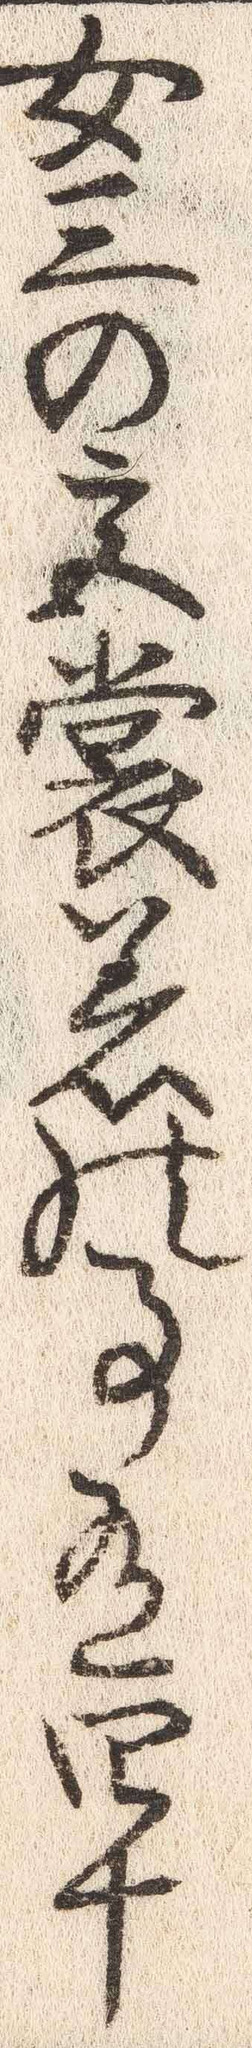女三の宮裳着の事有四十
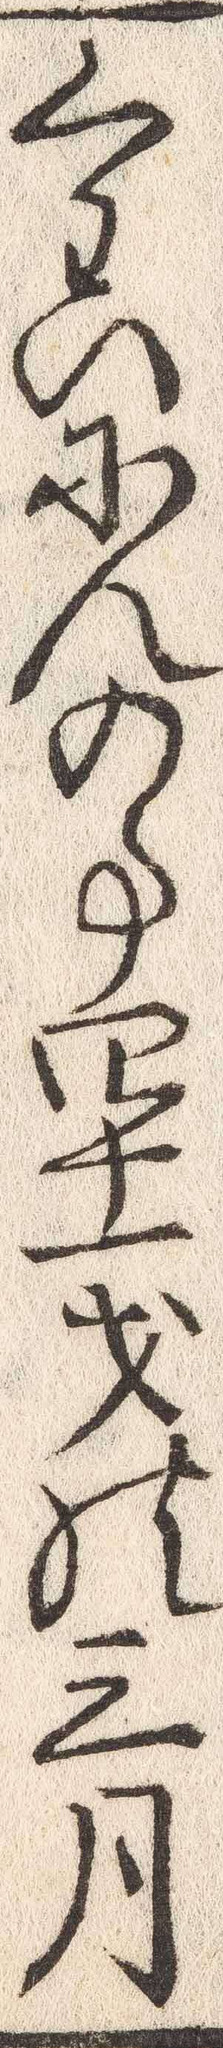くわいにんの事四十一戈の三月
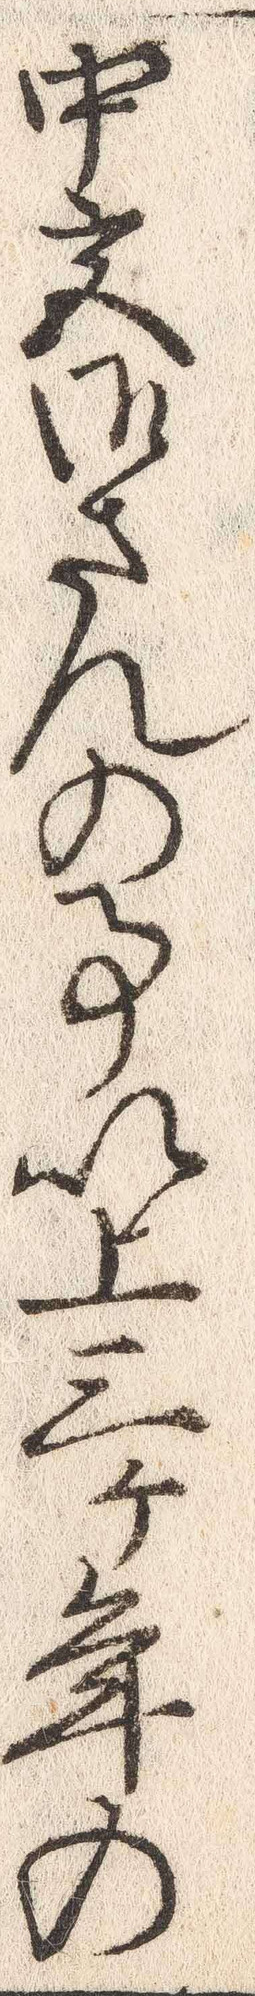中宮御さんの事以上三ヶ年の
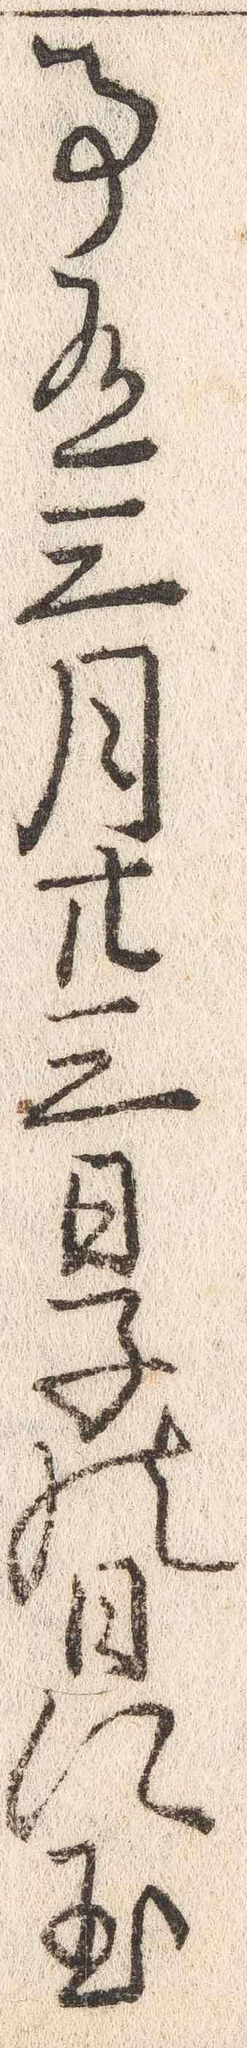事有三月廿三日子の日に玉
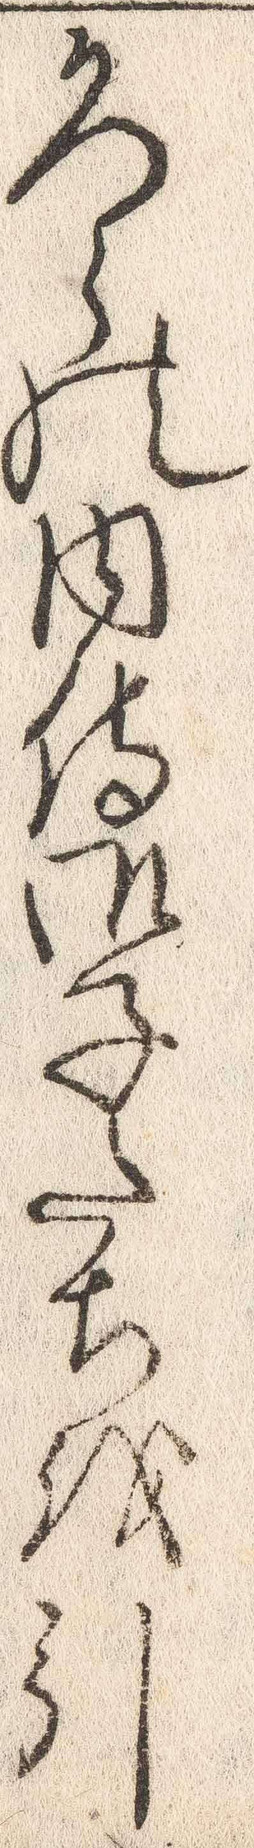かつらの内侍御子たちを引
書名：源氏物語
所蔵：東京学芸大学附属図書館 国文学研究資料館
